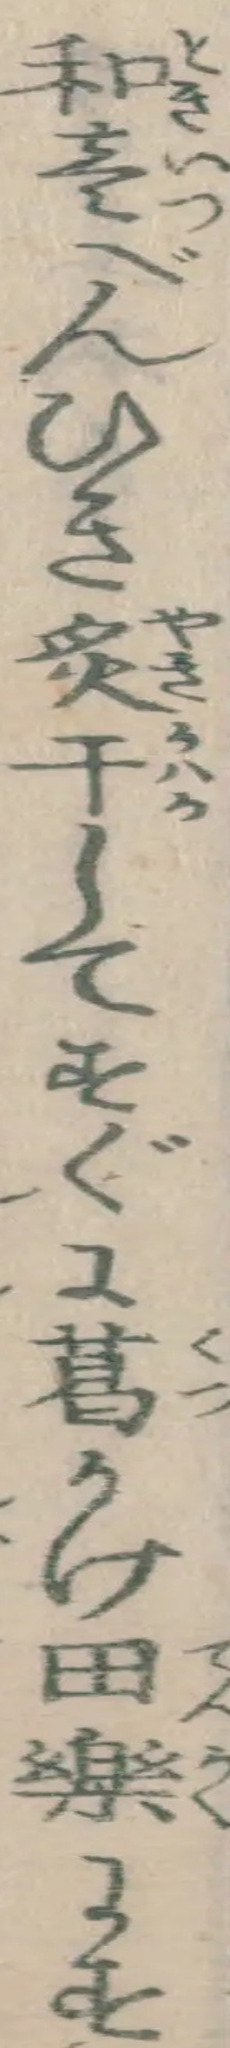和壱ぺんひき炙干してすぐに葛かけ田楽にす
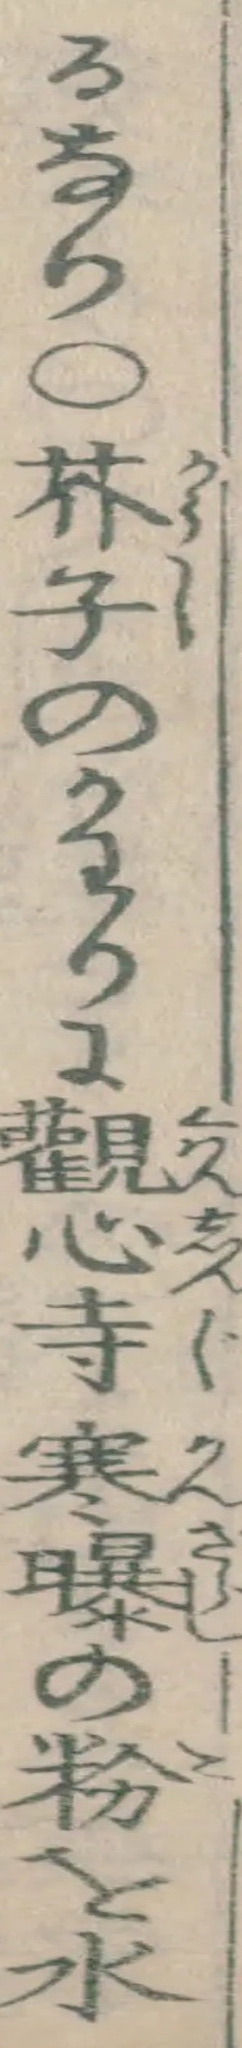るなり○芥子のかわりに観心寺寒曝の粉を水
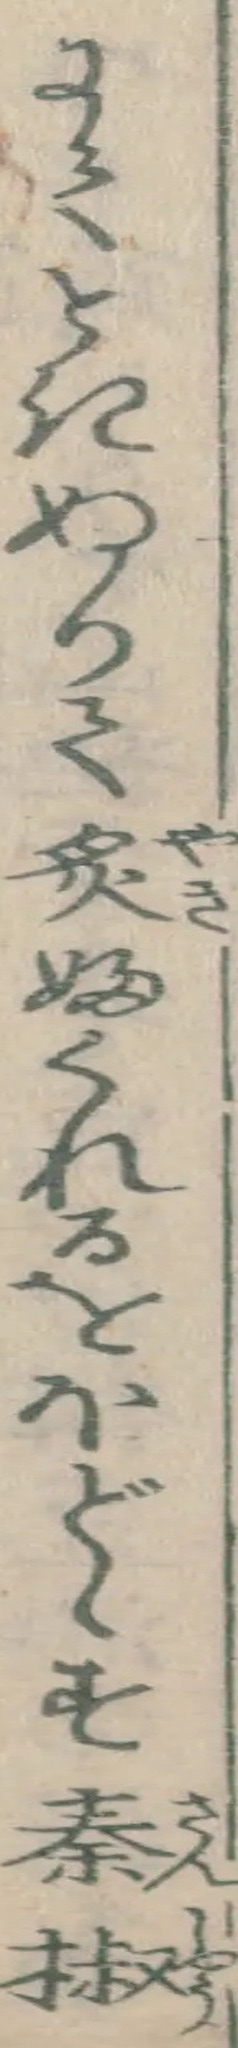にてときぬりて炙ふくれるをほどゝす秦椒
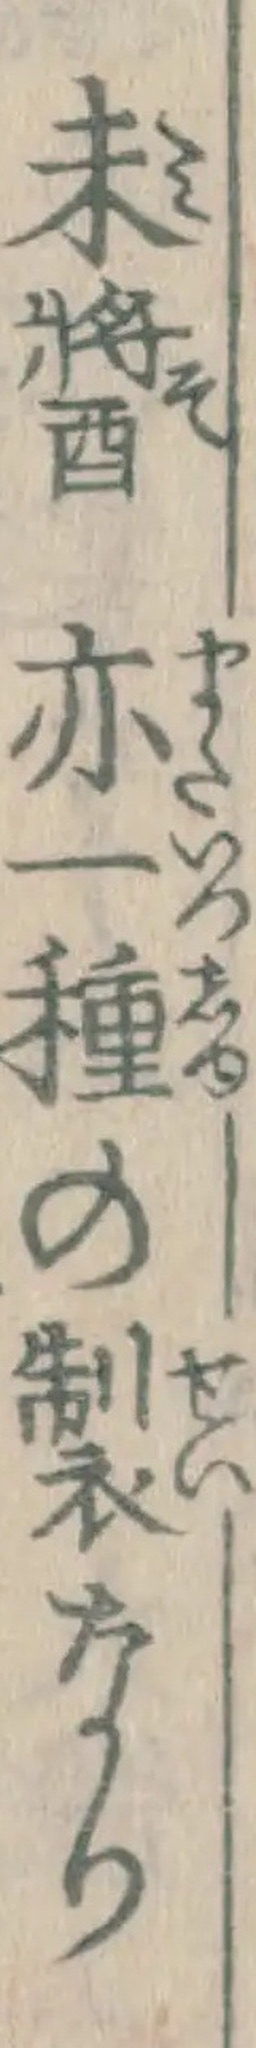未醤亦一種の製なり
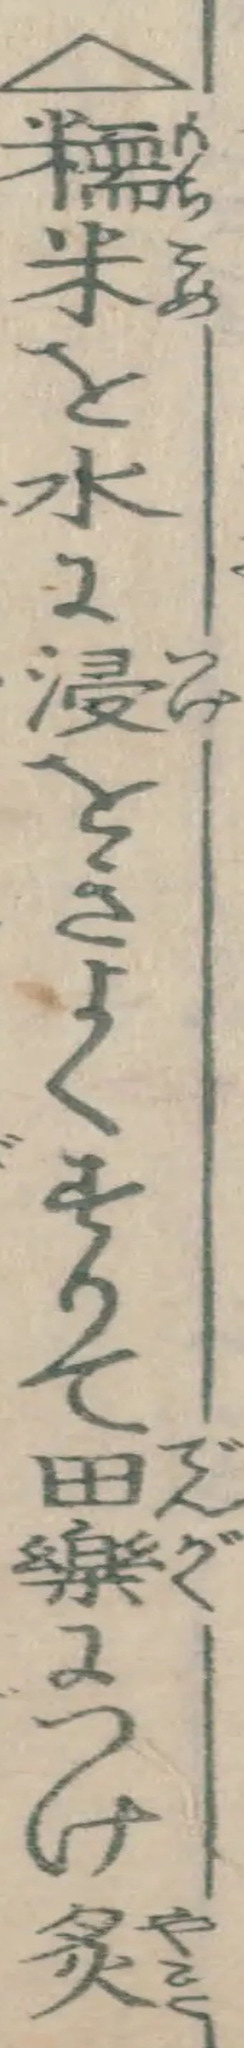△糯米を水に浸をきよくすりて田楽につけ炙
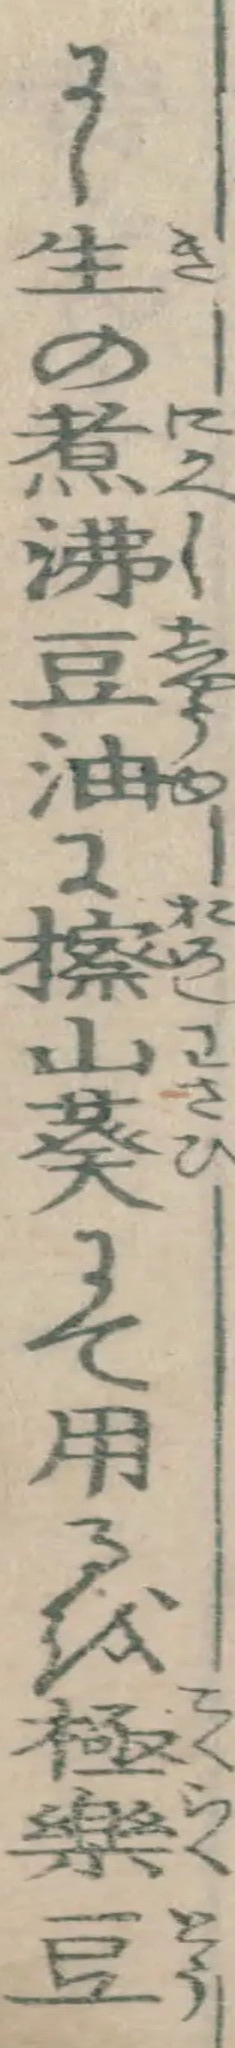にし生の煮沸豆油に擦山葵にて用るを極楽豆

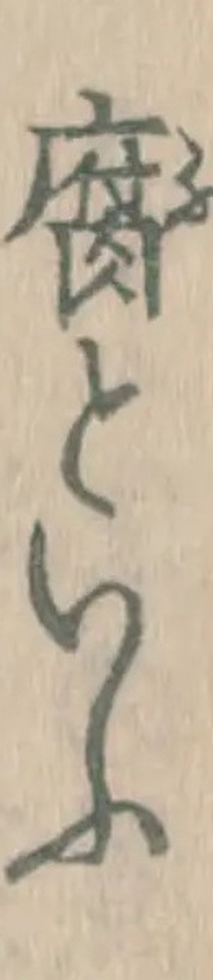腐といふ
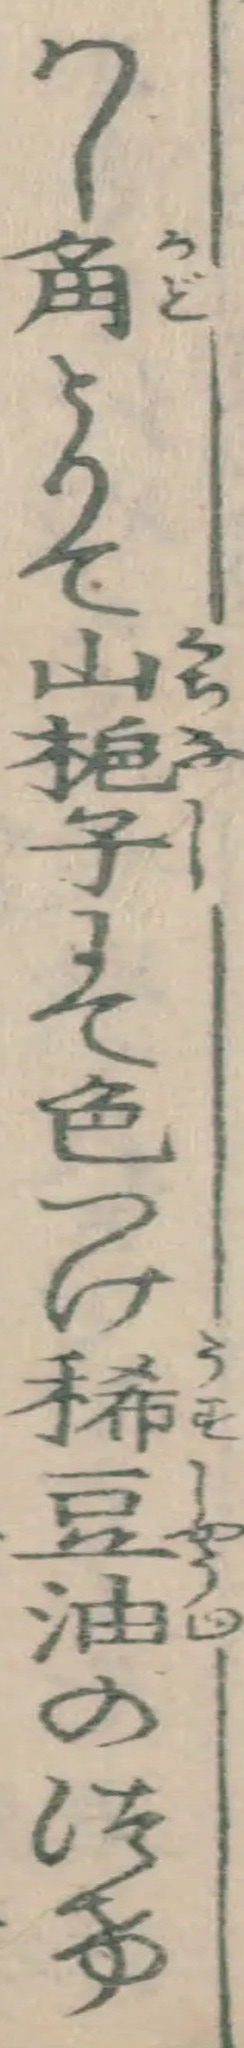はし角とりて山梔子にて色つけ稀豆油のつけ
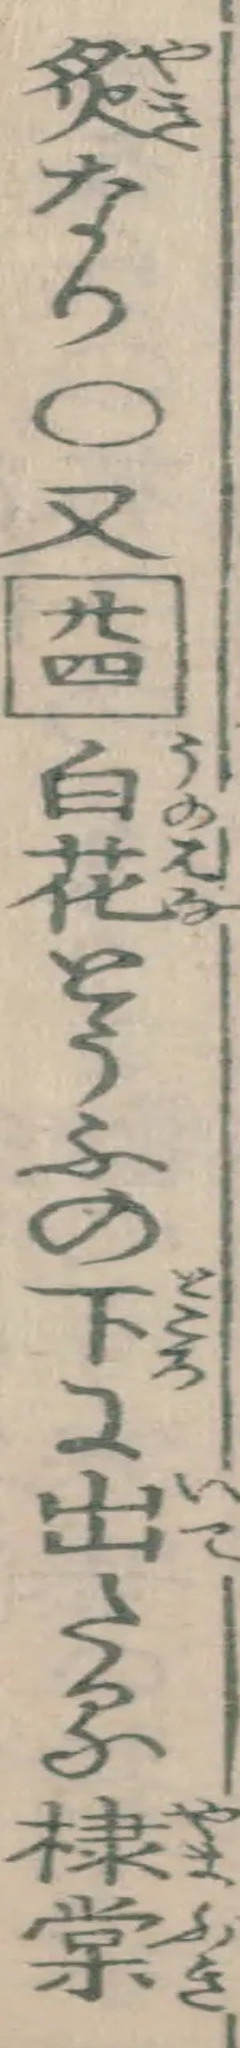炙なり○又廿四白花とうふの下に出たる棣棠
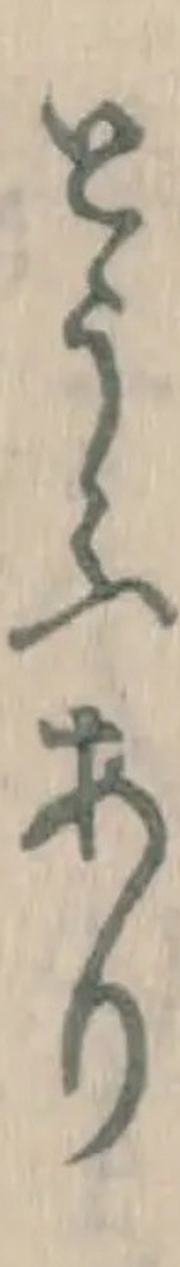とうふあり
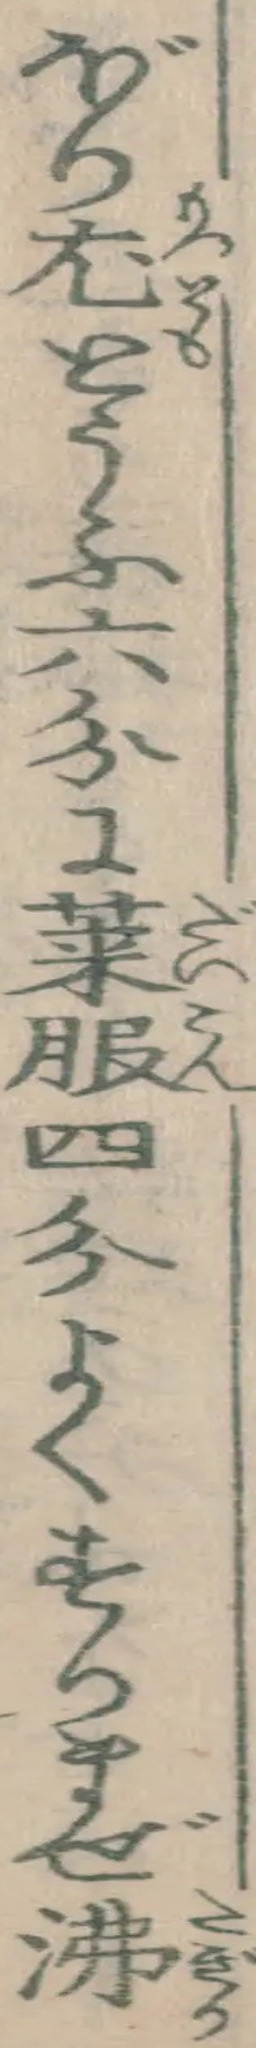ぼり尤とうふ六分に莱服四分よくすりまぜ沸
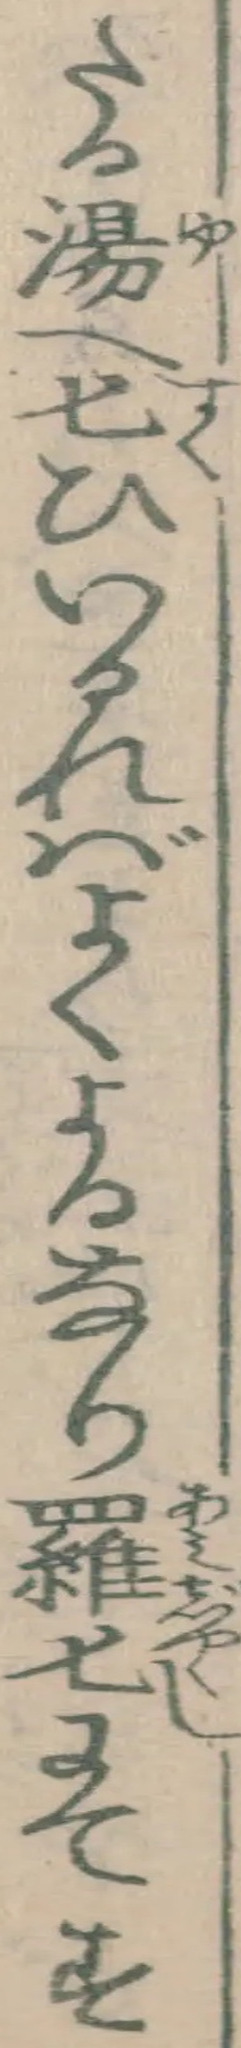たる湯へ匕ひいるればよくよるなり羅匕にてす
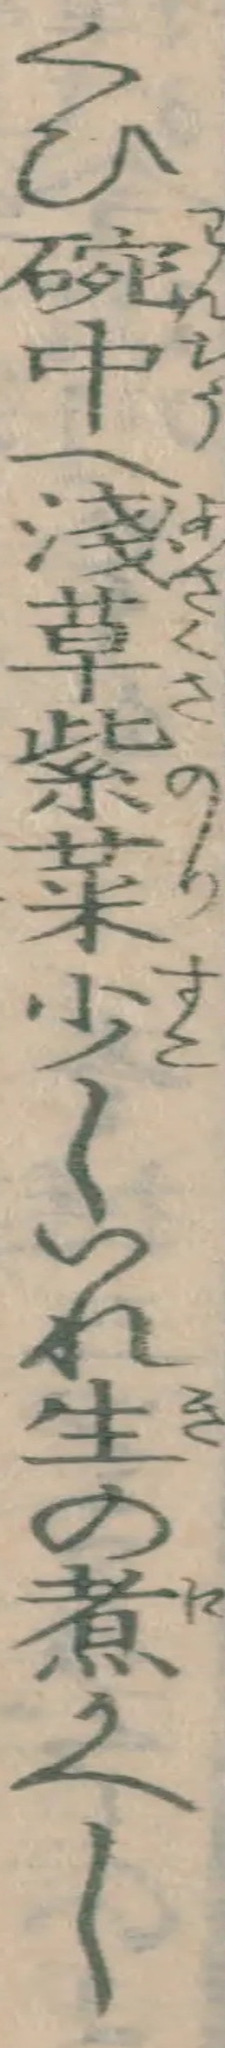くひ碗中へ浅草紫菜少しいれ生の煮かへし
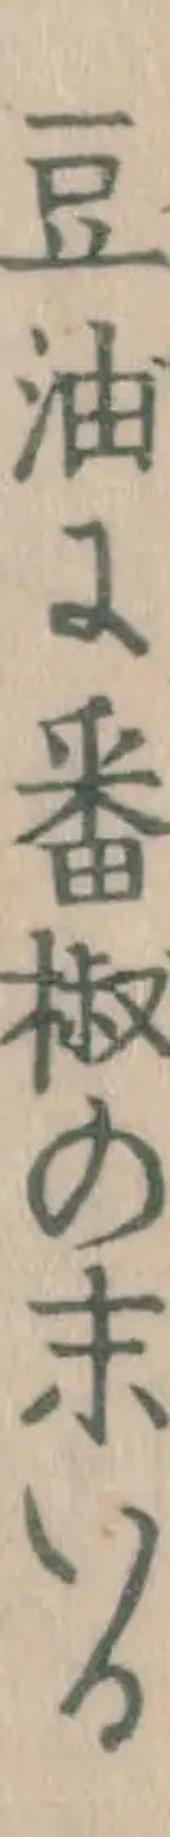豆油に番椒の末いる
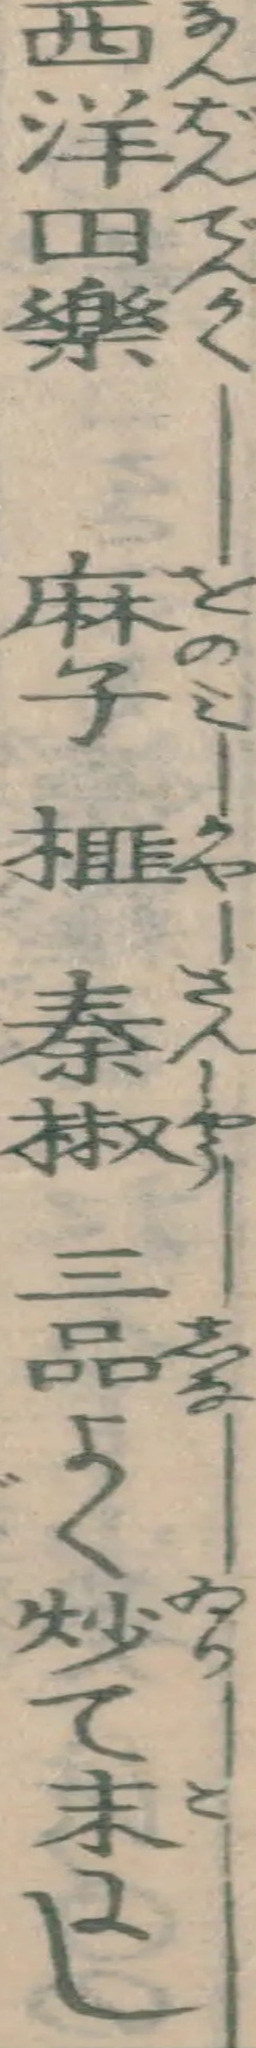五十西洋田楽麻子榧秦椒三品よく炒て末にし
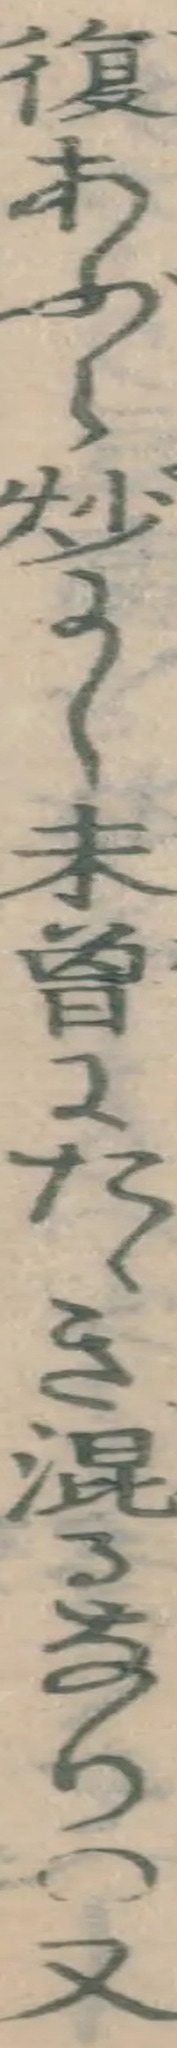復あぶら炒にし未曽にたゝき混るなり○又
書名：豆腐百珍. 続編
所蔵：国立国会図書館 National Diet Library, JAPAN
